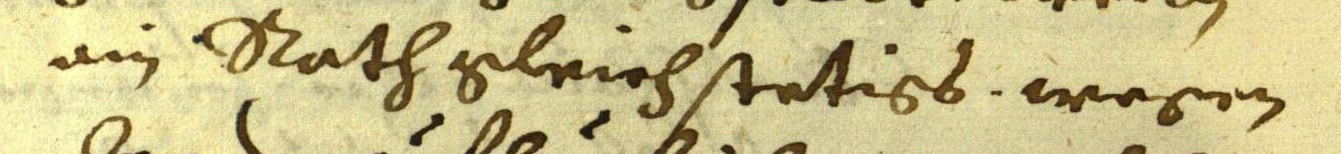ain Rath gleich stetigs. wegen
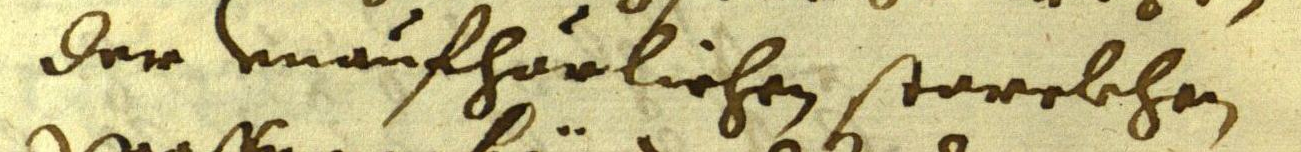der vnaūfhōrlichen starckhen
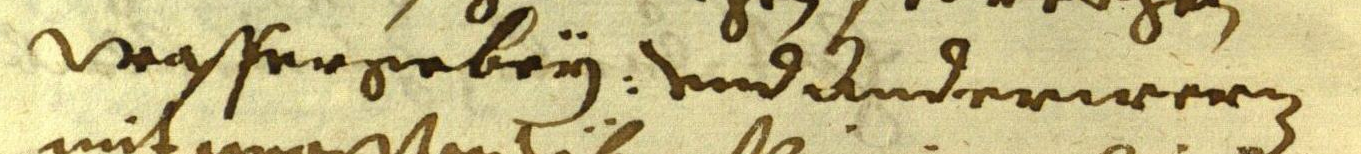Wassergebeÿ: vnd Anderwerz
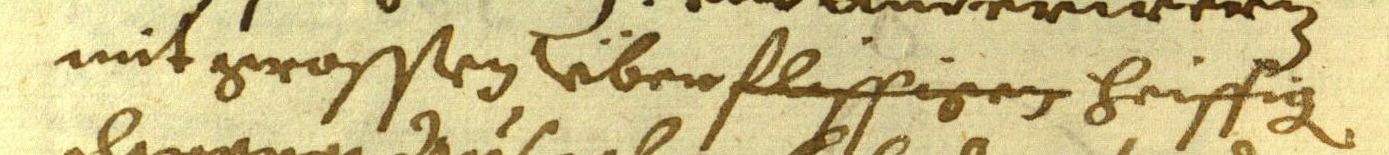mit grossen v̈berflissigen heiffig
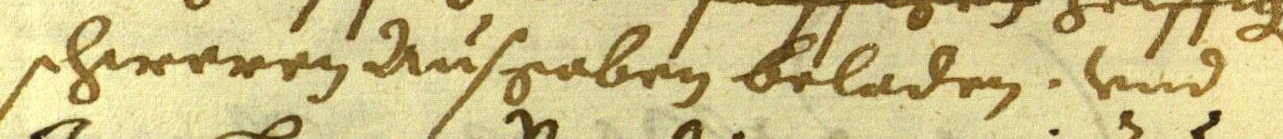schweren Aūsgaben beladen. vnd
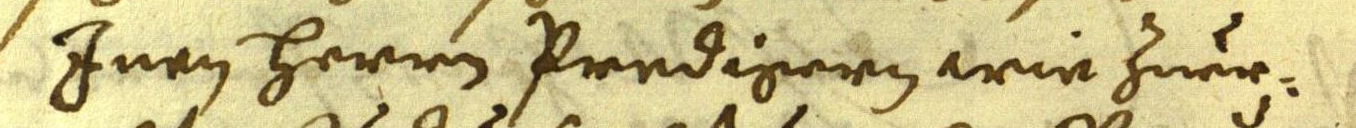Inen Herrn Predigern wie Zūer¬
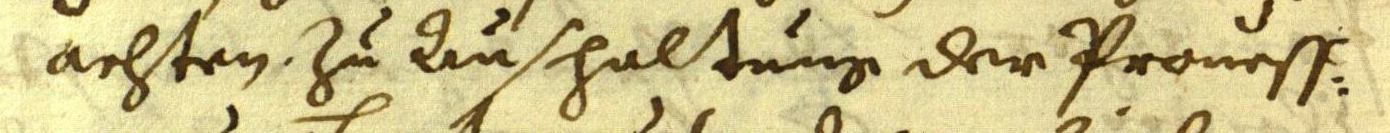achten. Zū Aūshaltūng der Proūess¬
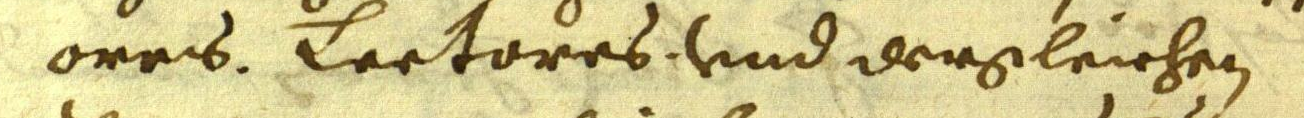ores. Lectores. vnd dergleichen
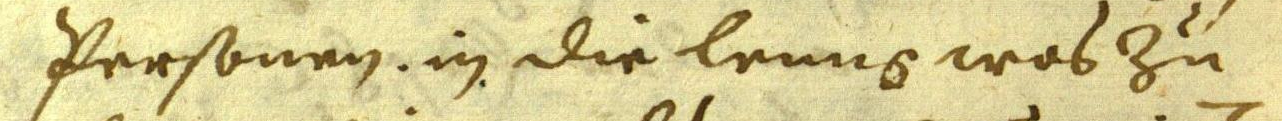Personen. in die lenng was Zū
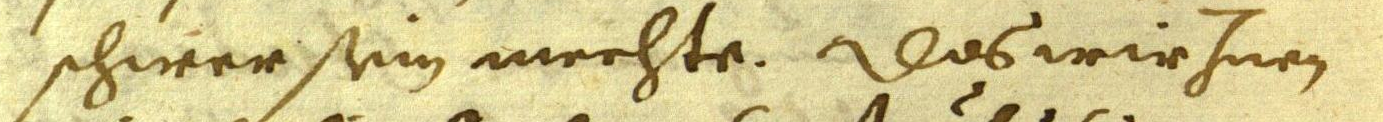schwer sein mechte. das wir Inen
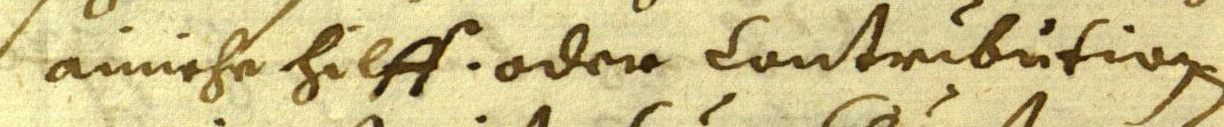ainiche hilff. oder Contribūtionen
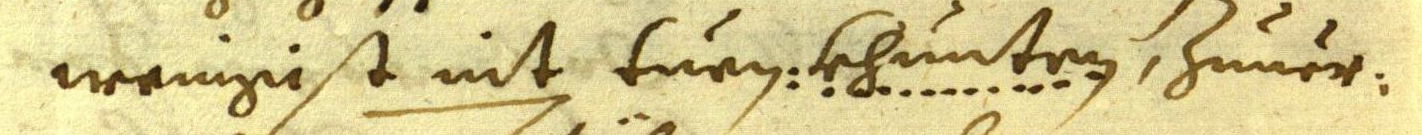wenigist nit tūen. khūnten, Zūuēr¬
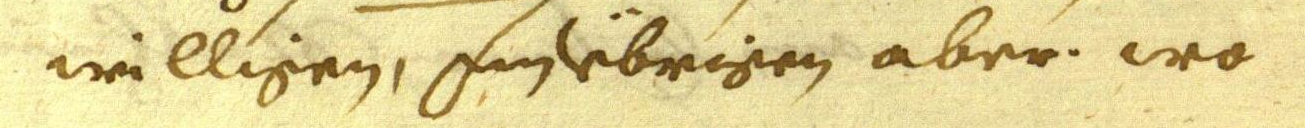willigen, Im v̈brigen aber. wo
